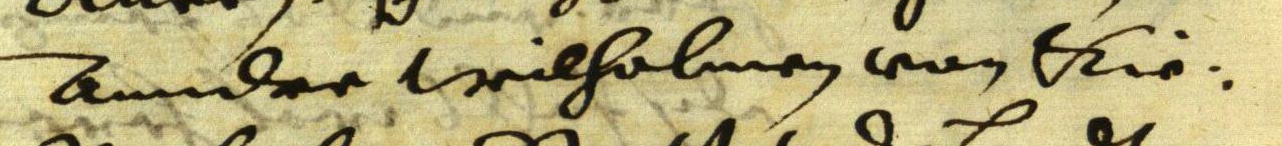Anndre Wilhalmen von Kie¬
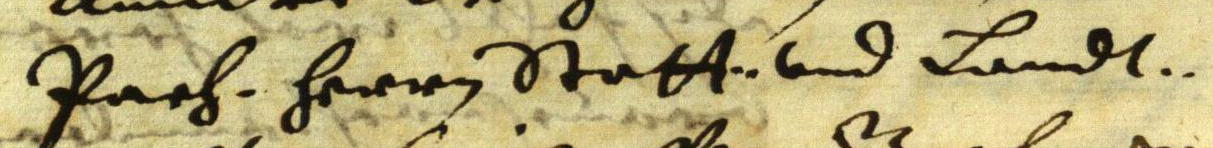Pach. herrn Statt: vnd Landt¬
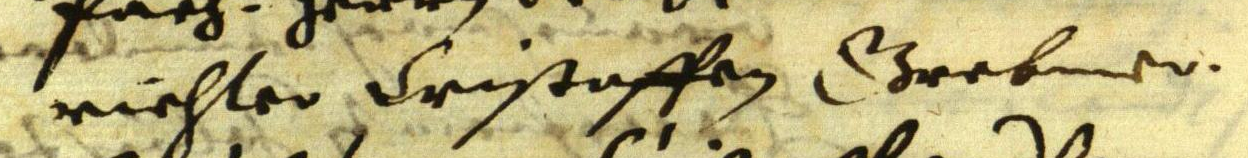richter Cristoffen Grebmer.
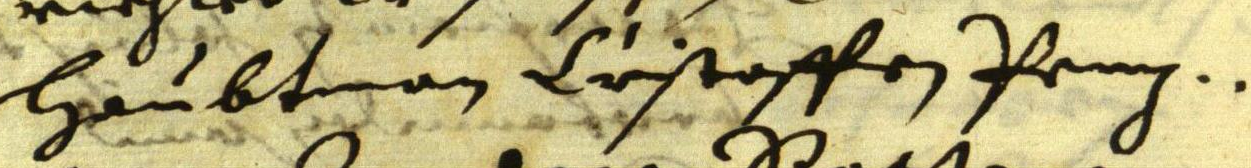Haūbtman Cristoffen Penz¬
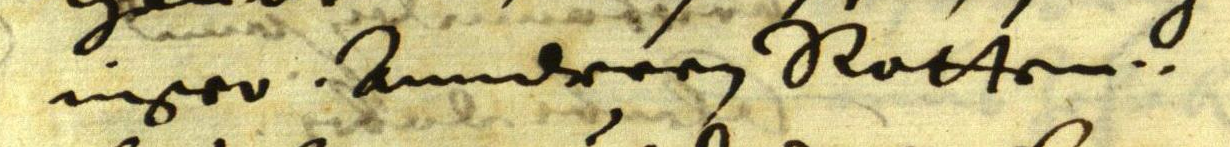inger. Anndreen Rotten¬
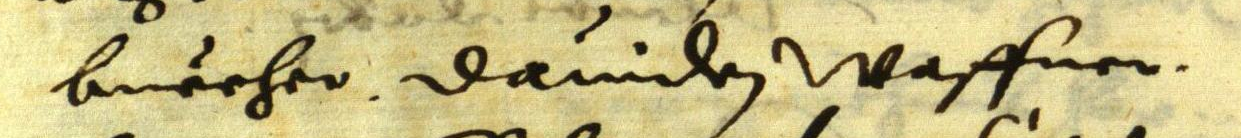būecher. Daūiden Waffner.
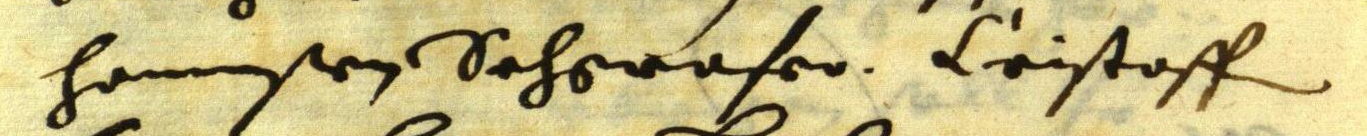Hannsen Schgrafer. Cristoff
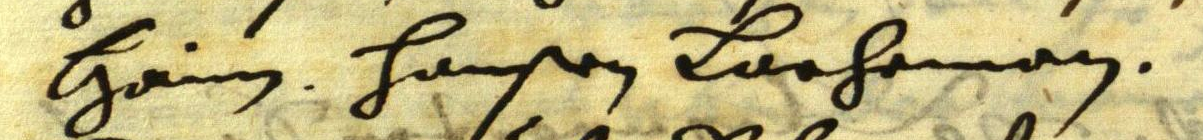Haim. hannsen Locheman.
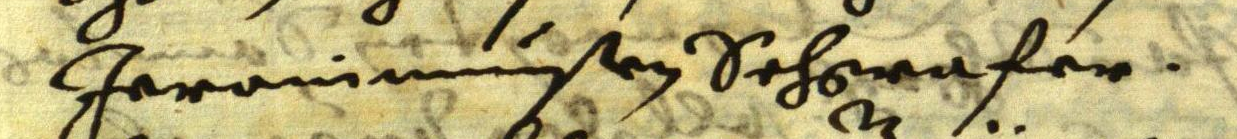Jeronimūsen Schgrafer.
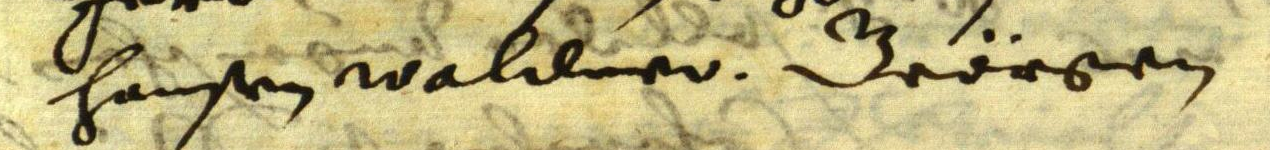hansen Waldner. Geörgen
